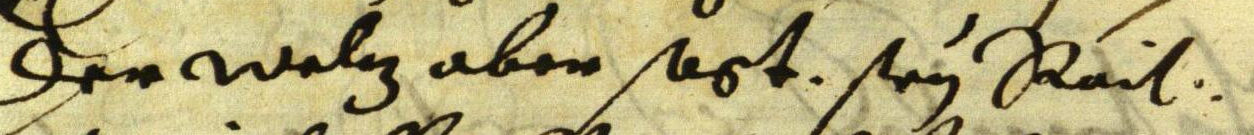Der Walz aber sagt. sein Rait¬
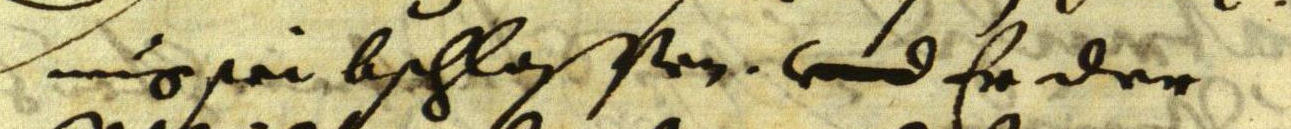ūng sei beschlossen. vnd Er der
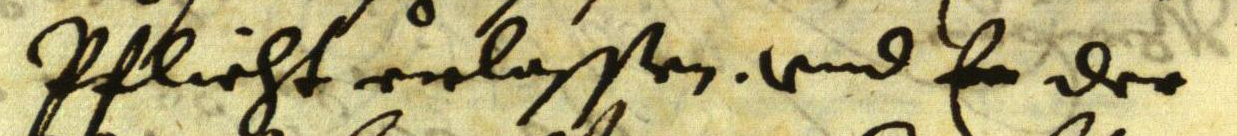Pflicht erlassen. vnd Er der
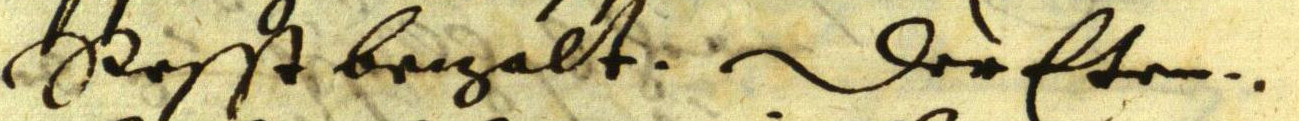Resst bezalt. Der Eten¬
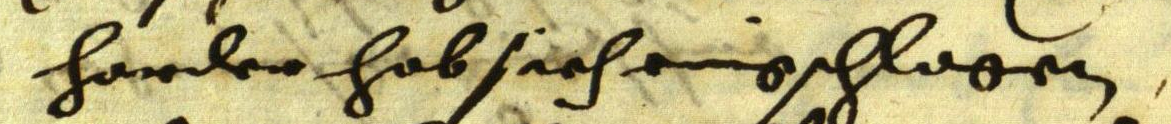harder hab sich eingschlagen
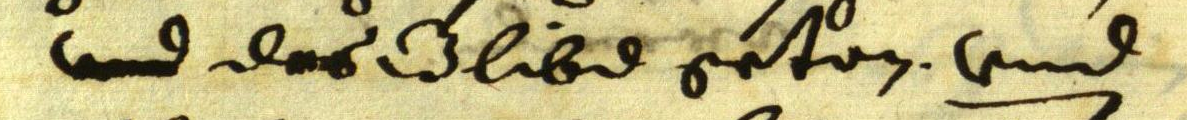vnd das Glibd getan. vnd
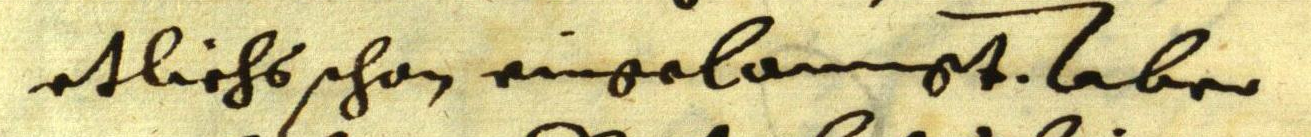etlichs schon eingelanngt. Aber
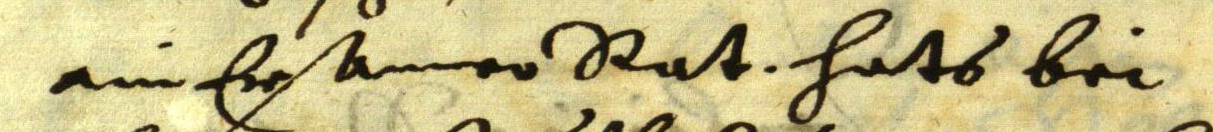ain Ersamer Rat. hats bei
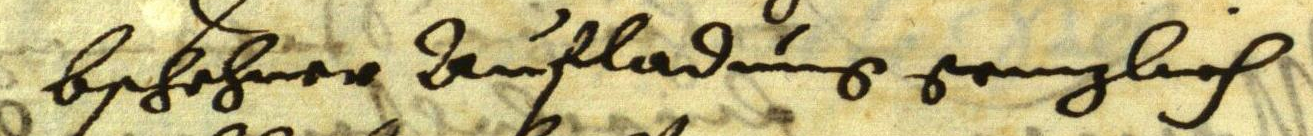bschehner Aūfladūng gennzlich
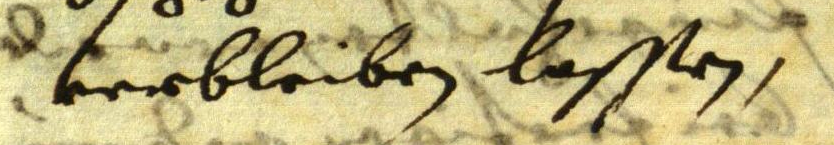verbleiben lassen,
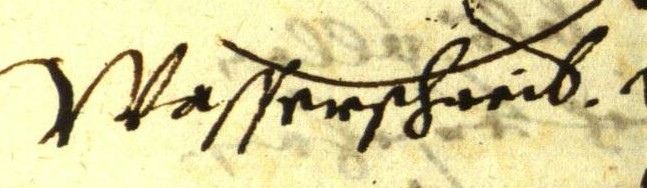Wasserschreib.
